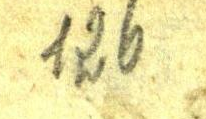126
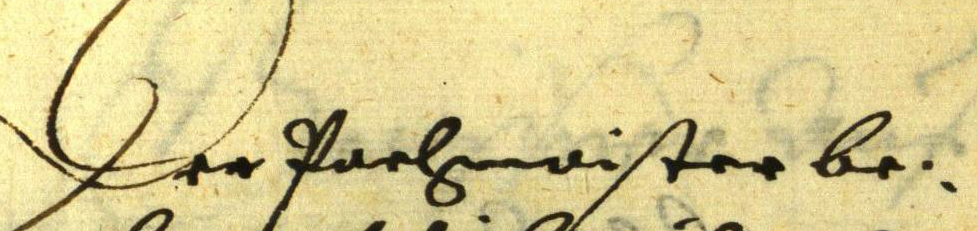Der Pachmaister be¬
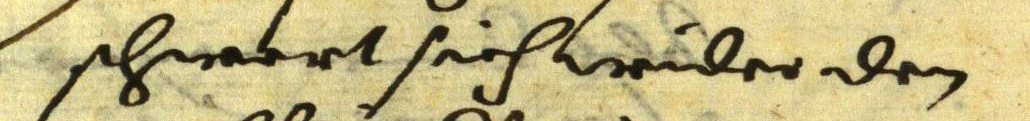schwert sich wider den
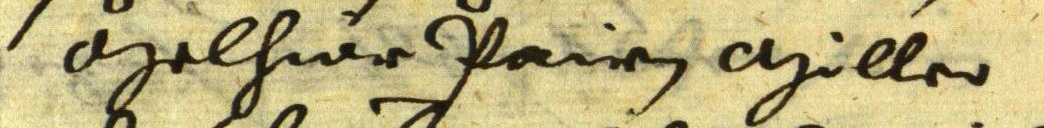Melchior Pairn Miller
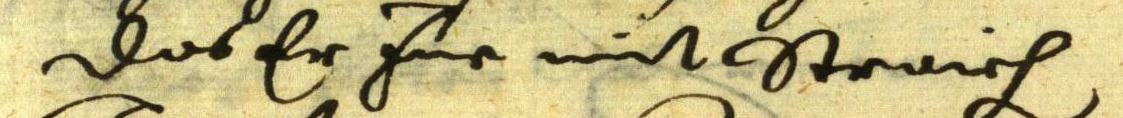das Er Ine mit Straich
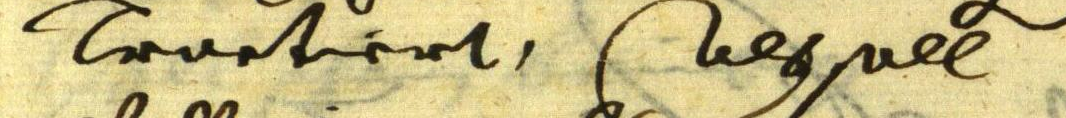Tractiert, Als soll
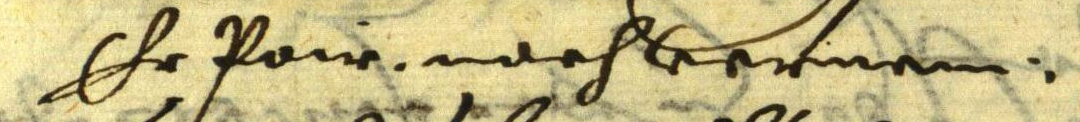Er Pair. nach vernem¬
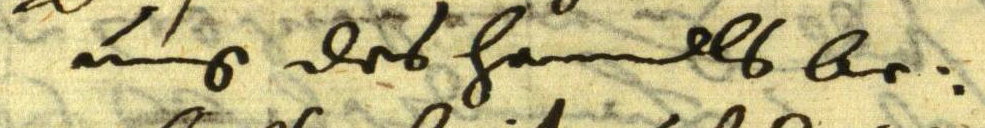ūng des hanndls be¬
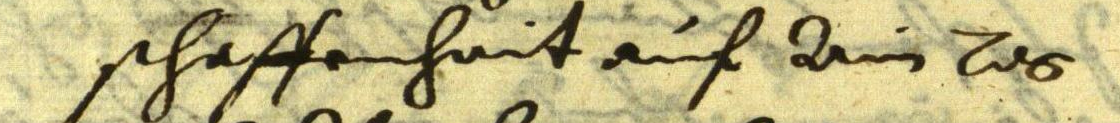schaffenhait aūf Ain Tag
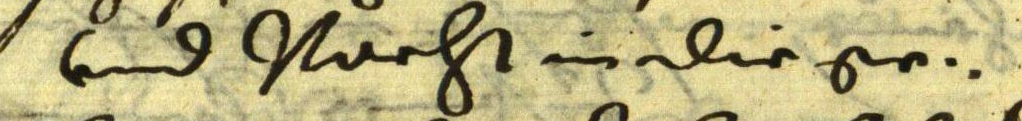vnd Nacht in die ge¬
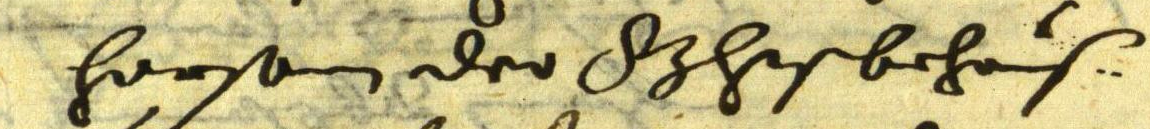horsam der Ghtsbehaūs¬
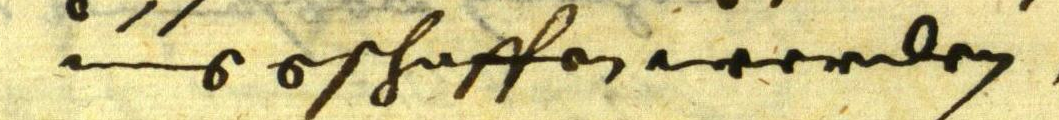ūng gschaffen werden,
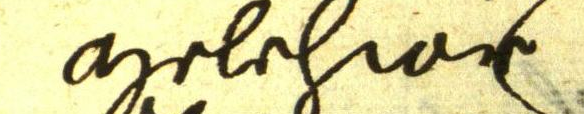Melchior
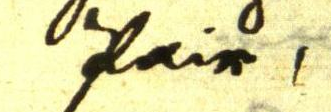Pair,
